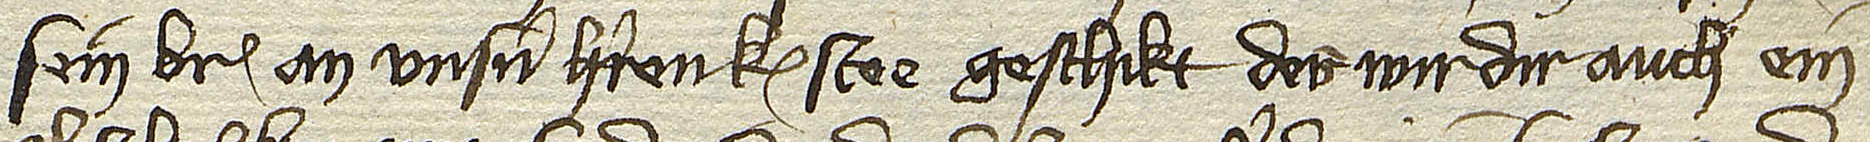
ſein br* an vnſn* h*ren k* ſtee geſchikt der wir dir auch ein
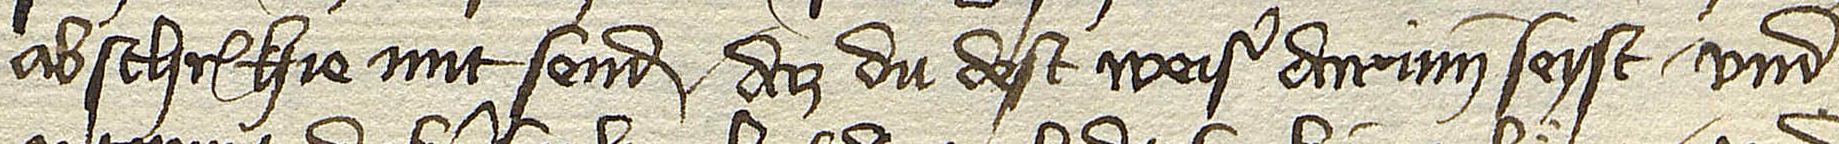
abſchr* hie mit ſend* / daʒ du deſt weiſ* darinn* ſeyſt / vnd
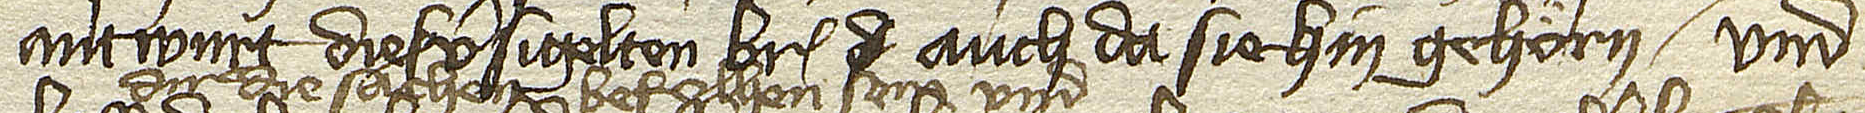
antwurt dieſ* v*ſigelten br* d auch da ſie hin gehörn / vnd
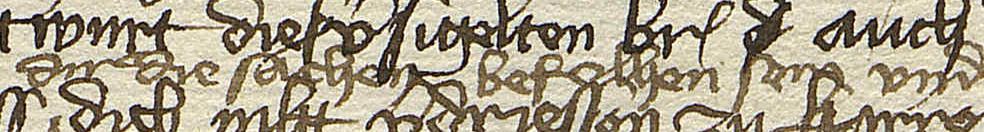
dir die ſachen befolhen ſein vnd
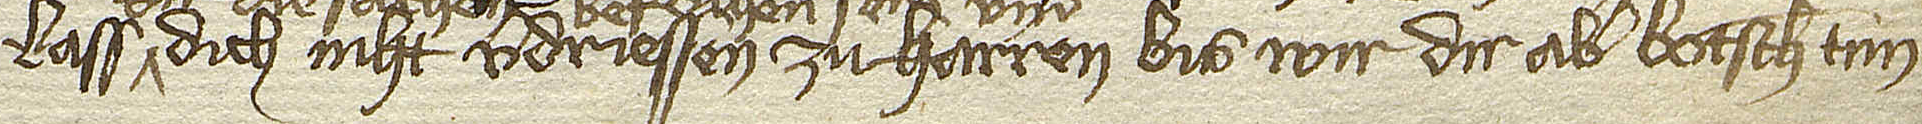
laſſ dich niht v*drieſſen ʒu harren bis wir dir ab* botſch* tun
